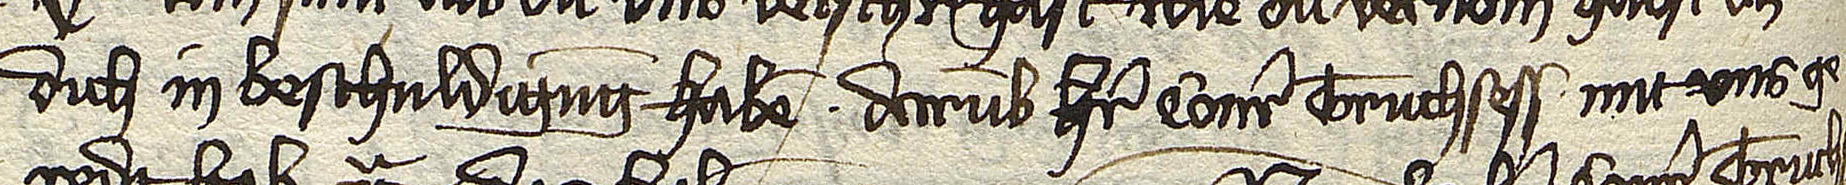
dich in beſchuldigung habe* . darub* h*r Conr* Truchſeſſ mit vns ge =
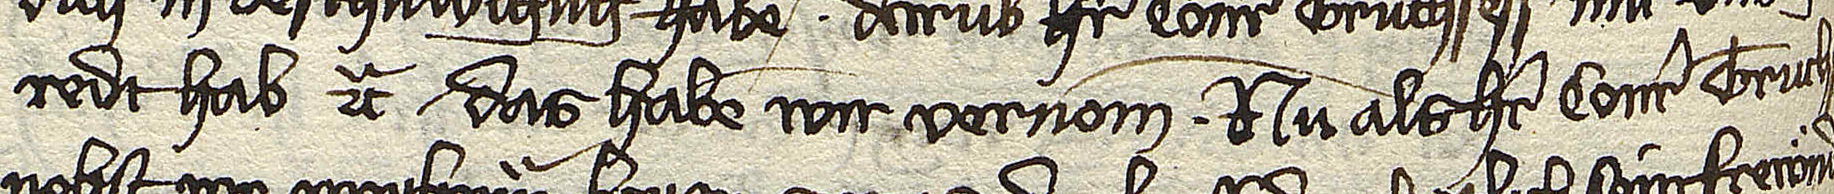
redt hab ec* / Das habe* wir vernom* . Nu als h*r Conr* Truchſ*
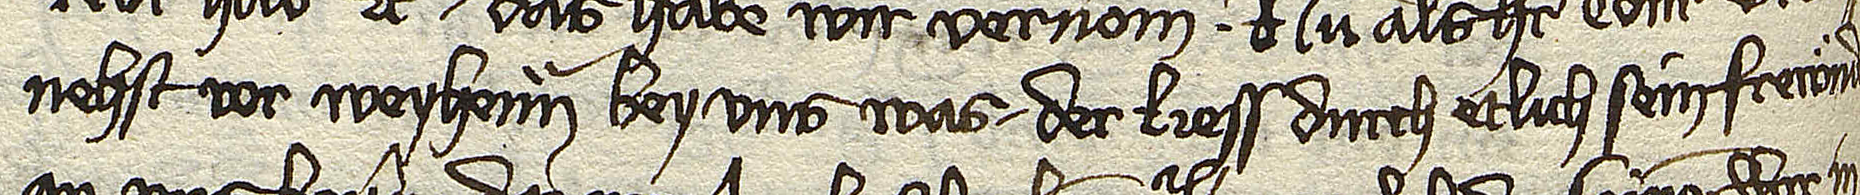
nehſt vor weyhenn* bey vns was / der lieſſ durch etlich ſein freẅnde
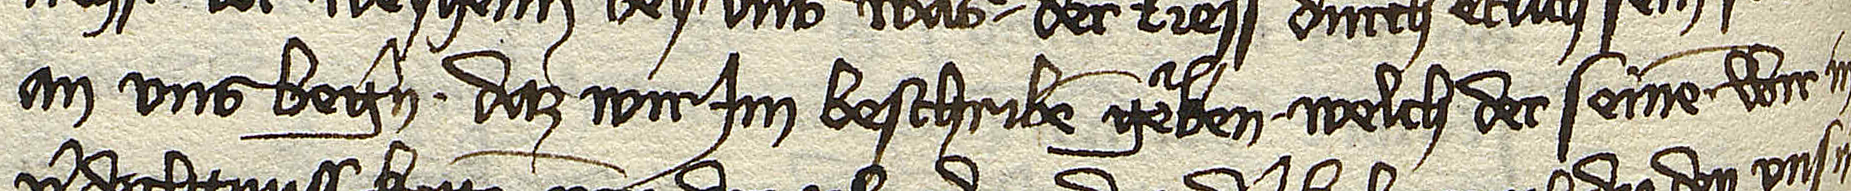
an vns beg*n . daʒ wir Im beſchribe* gëben . welch der ſeine* . wir in
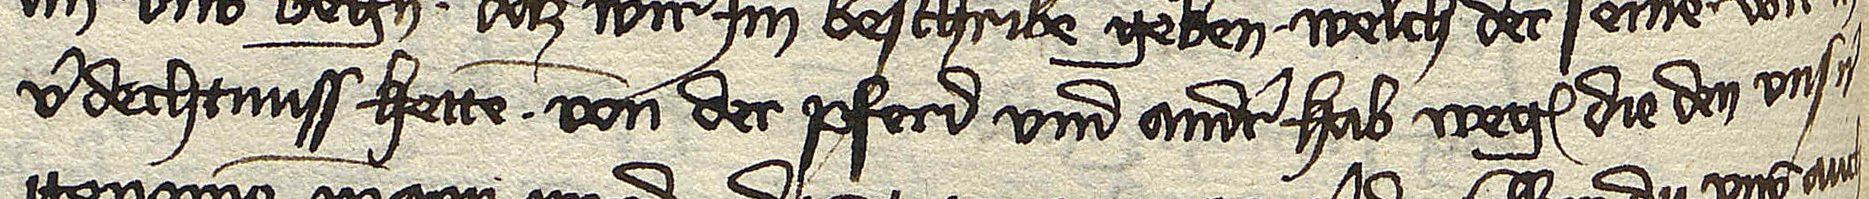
v*dechtnuſſ hette* . von der pferd vnd and*r hab weg* die den vnſ*n
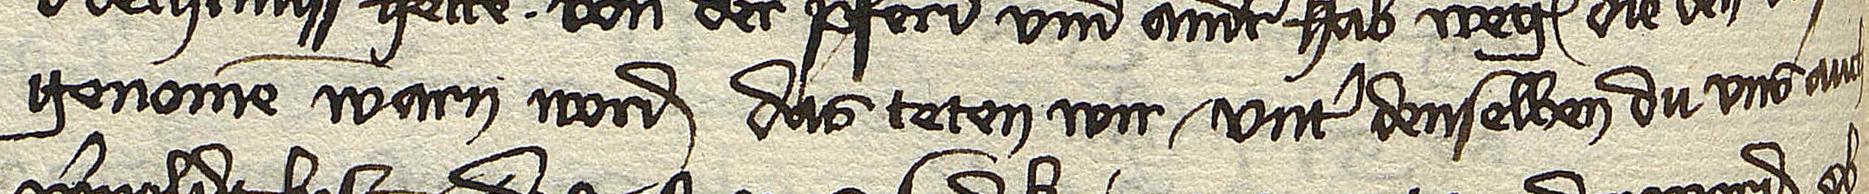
genome* warn word* das teten wir / vnt* denſelben du vns auch
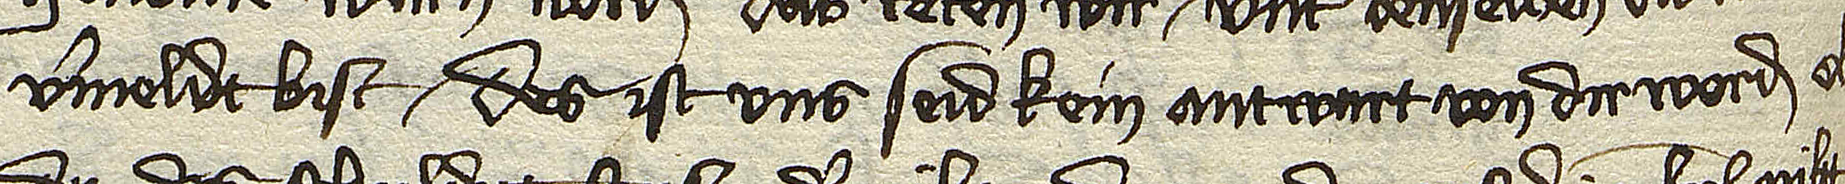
v*meldt biſt / Des iſt vns ſeid kein antwurt von dir word* Ob
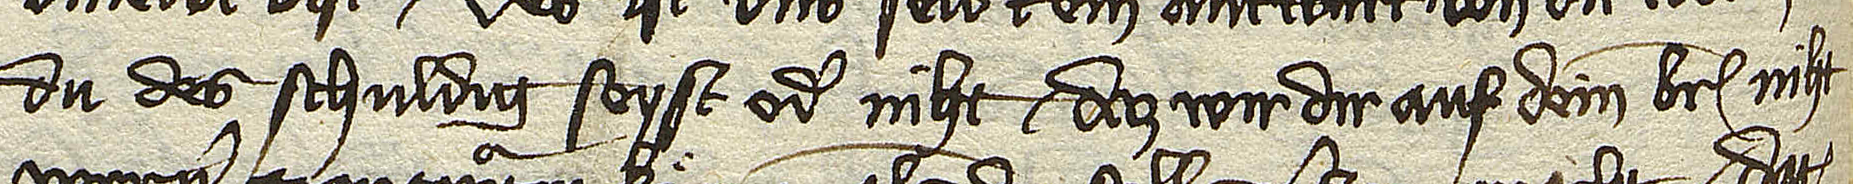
du des ſchuldig ſeyſt od* niht / daʒ wir die auf dein* br* niht
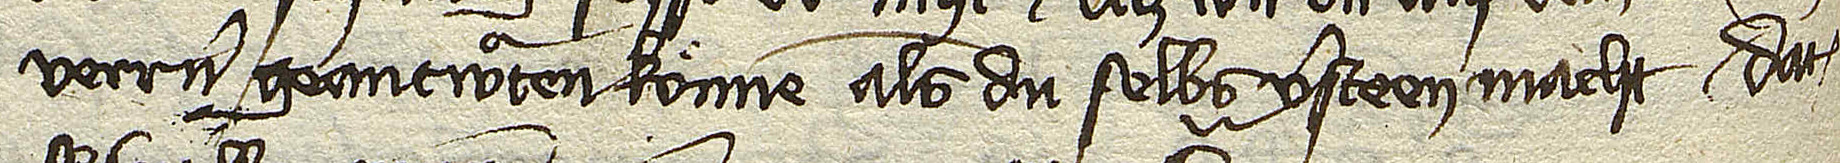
verr*n geantw*ten könne* als du ſelbst v*ſteen macht / Dat*
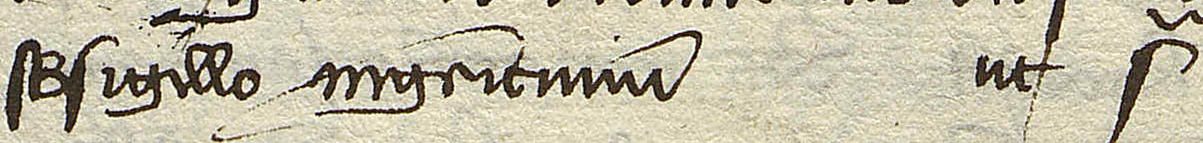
ſ*b ſigillo mgricuiu* ut ſ*
